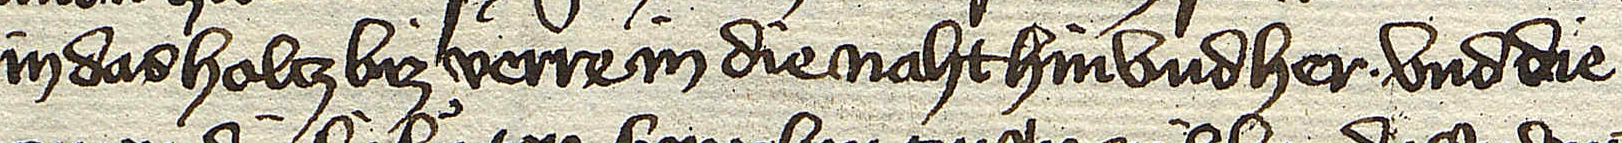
in das holcʒ biʒ verre in die naht hin vnd her . vnd die
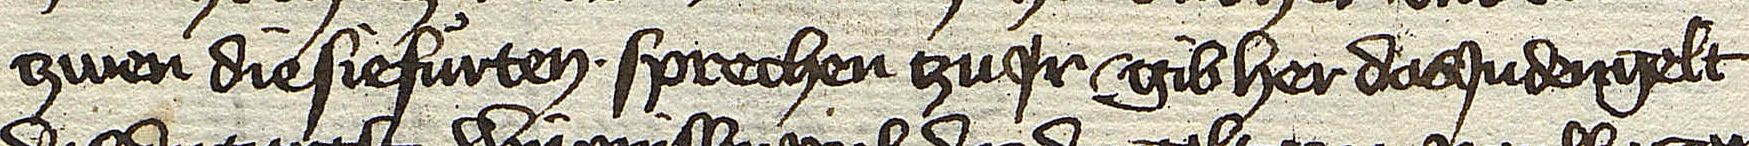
cʒwen die ſie ſürten . ſprechen cʒu Ir / gib her das Iudengelt
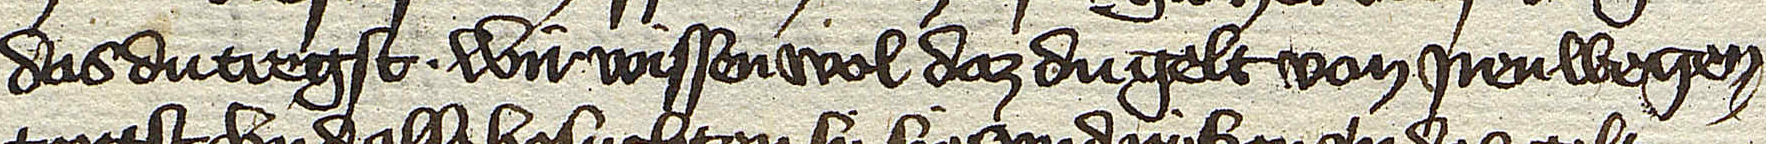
das du tregſt . wir wiſſen wol daʒ du gelt von Iren wegen
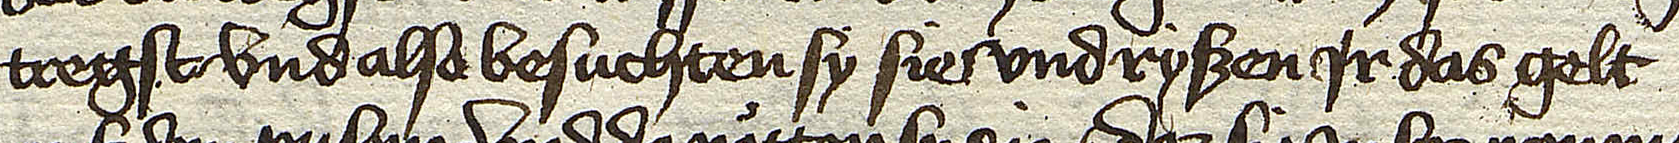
tregſt . vnd alſo beſuchten ſy ſie / vnd ryſʒen Ir das gelt
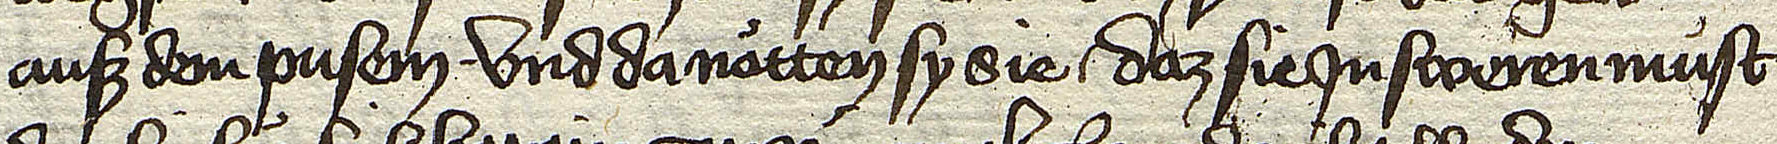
auſʒ dem puſem . Vnd da nötten ſy Sie / daʒ ſie In ſweren müſt
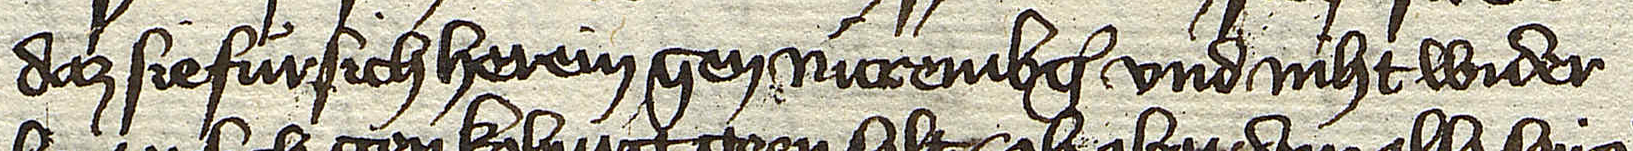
daʒ ſie für ſich herein gen Nürembg* vnd niht wider
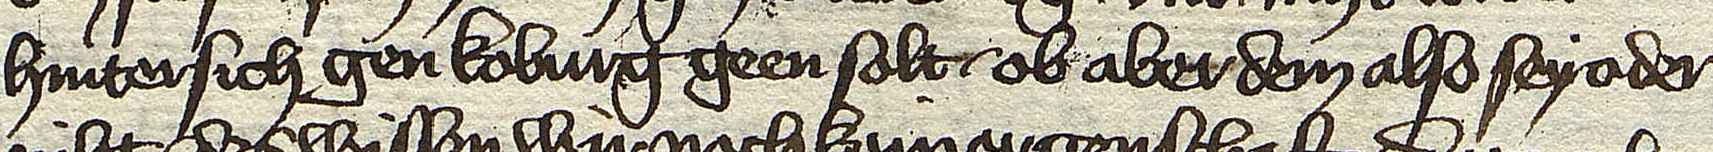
hinter ſich gen koburg geen ſolt / ob aber dem alſo ſey oder
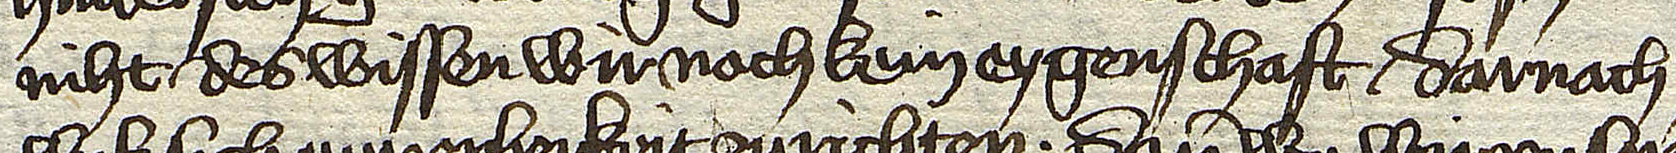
niht / des wiſſen wir noch kein eygenſchaft / darnach
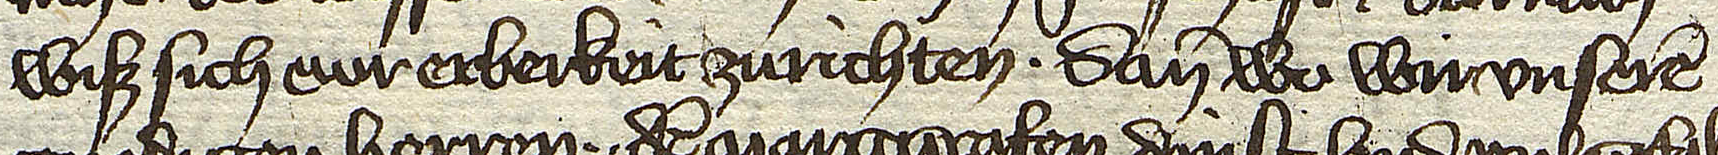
wiſʒ ſich ewr erberkeit cʒurichten . Dan* wo wir vnſere*
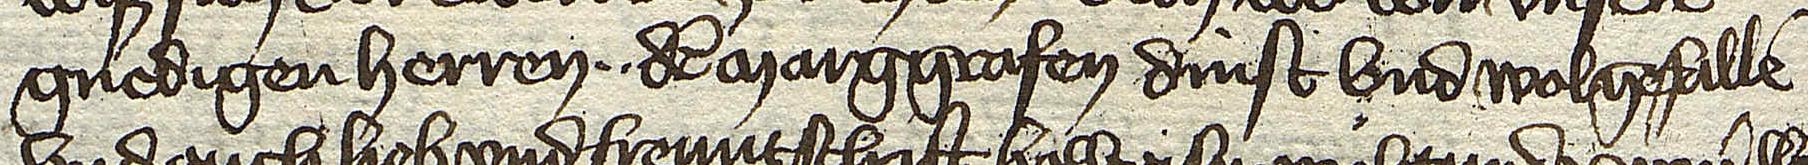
gnedigen herren ~ de* Marggrafen dienſt vnd wolgefalle*
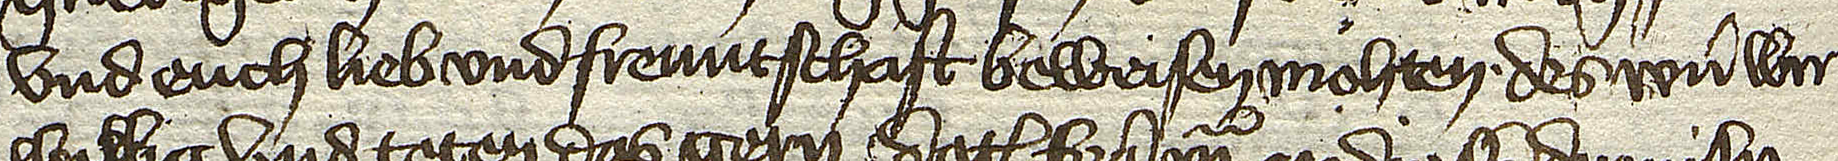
vnd euch lieb vnd freuntſchaft beweiſen möhten . des wn* wir
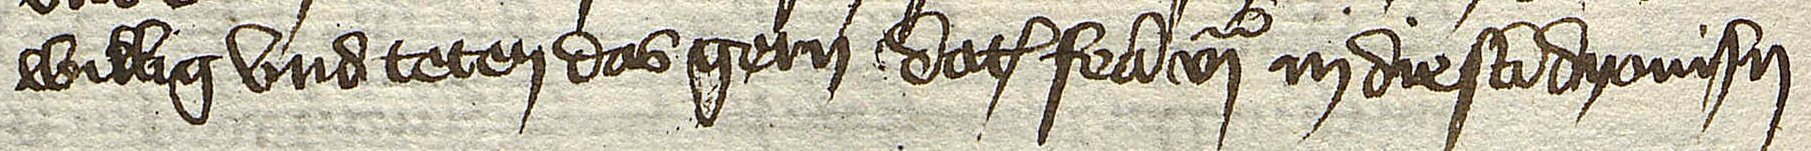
willig vnd teten das gern / dat* fea* vi* in die ſci* dyoniſii
